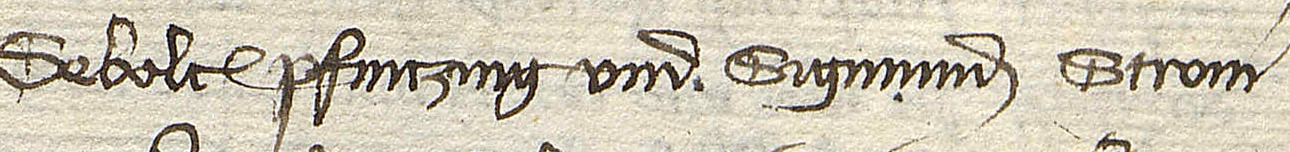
Sebolt* pfincʒing vnd Sigmund* Strom*
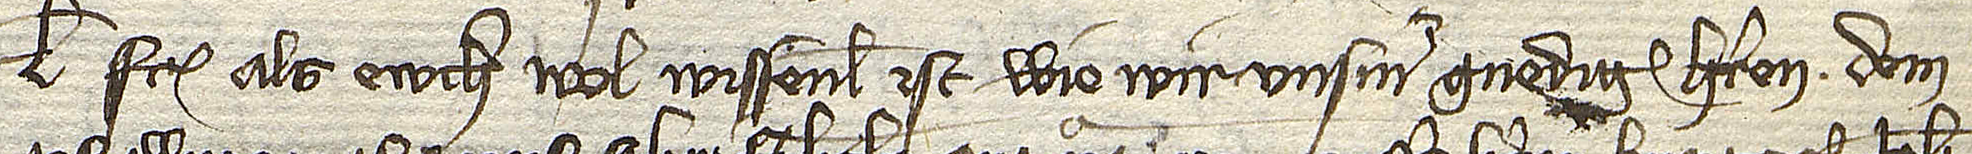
L* fr* als ewch wol wiſſenl* iſt wie wir vnſm* gnedig* h*ren . dem
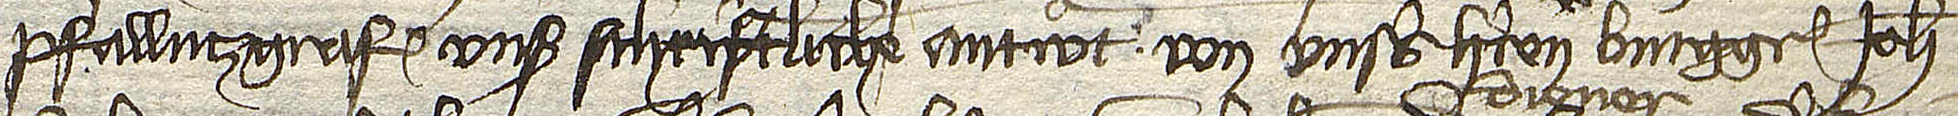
Pfallncʒgraf* vnſ* ſchriftliche antw*t von vnſ*s h*ren burggr* Ioh*
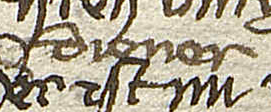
diener
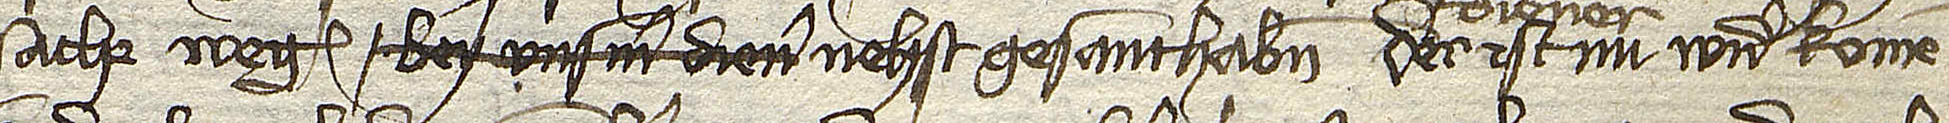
ſache weg* / bey vnſm* dien* nehſt geſant habn* Der iſt nu wid* kome*
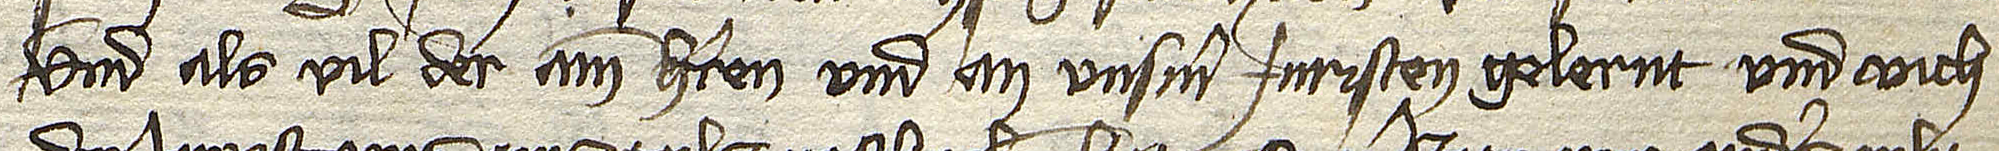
Vnd als vil der am* h*ren vnd an vnſm* Iuriſten gelernt vnd auch
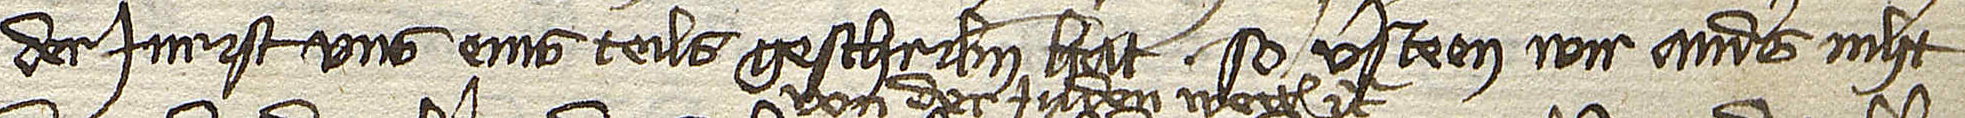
der Iuriſt vns eins teils geſchribn* hat / ſo v*ſteen wir and*s niht
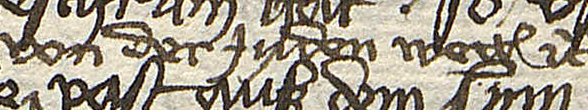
von der Iuden weg* ec*
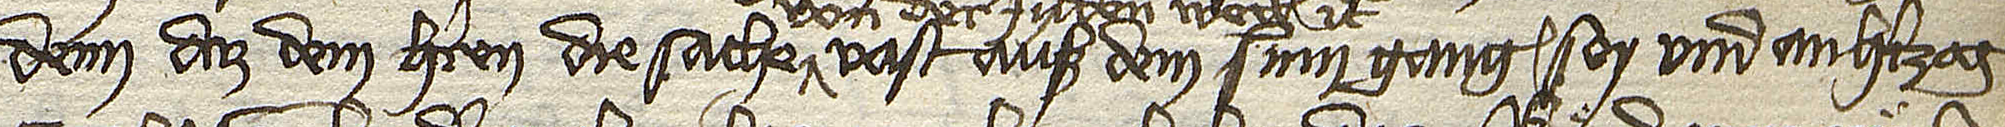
denn daʒ dem h*ren die ſache vaſt auſʒ dem ſinn gang* ſey vnd an h*cʒog
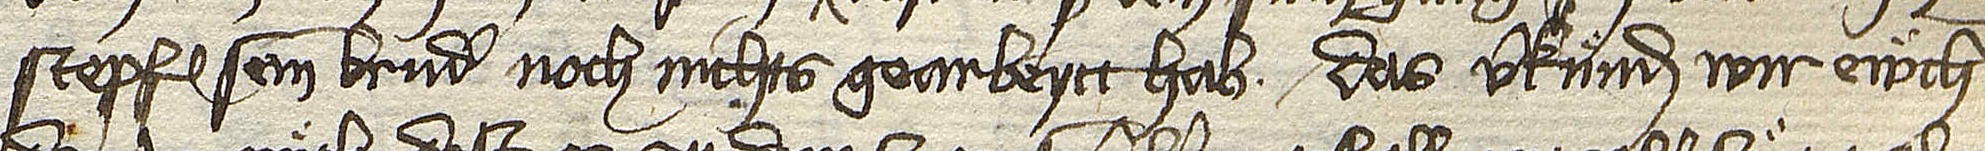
ſtepf* ſein brud* noch nichts gearbeytt hab . / Das v*künd* wir eẅch
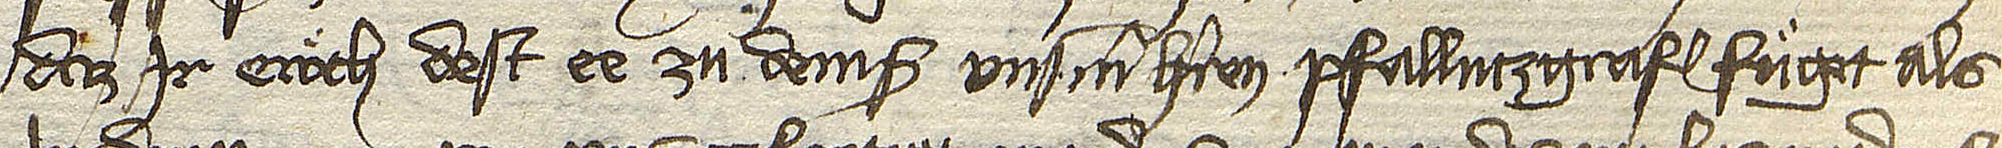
daʒ Ir eẅch deſt ee ʒu demſ* vnſm* h*ren pfallncʒgraf* füget als
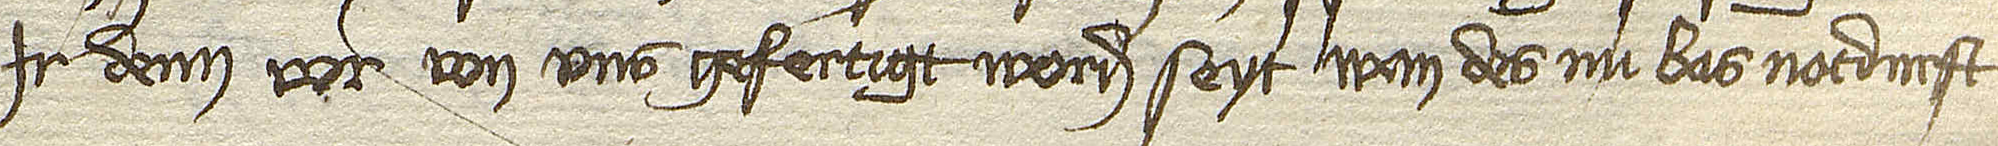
Ir denn vor von vns gefertigt word* ſeyt wan des nu bas notdurft
